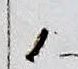1
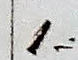1
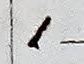1
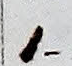1
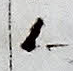1
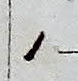1
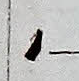1
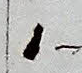1
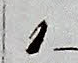1
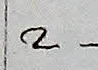2
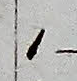1
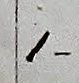1
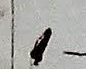1
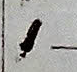1
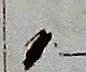1
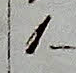1
